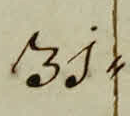31
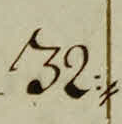32
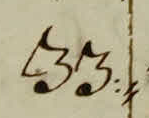33:
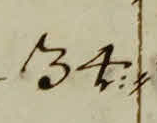34:
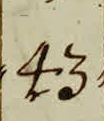43
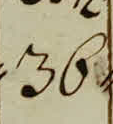36
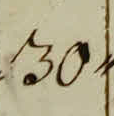30
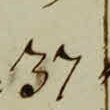37
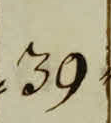39
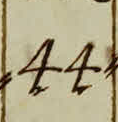44
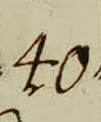40
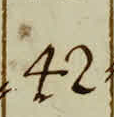42
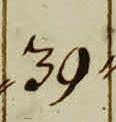39
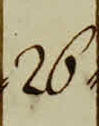26
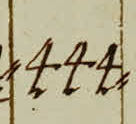444
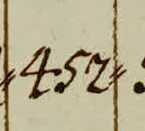452
